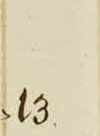13.
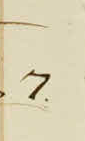7.
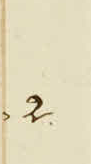2.
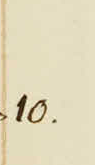10.
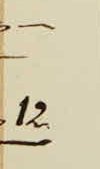12.
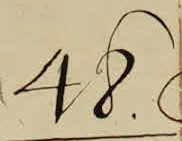48.
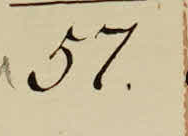57.
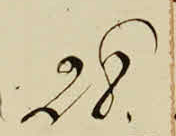28.
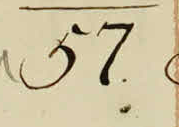57.
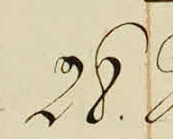28.
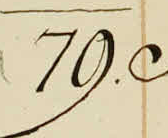79.
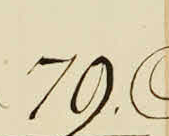79.
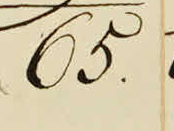65.
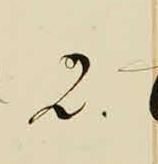2.
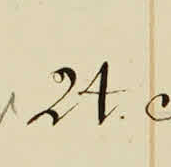24.
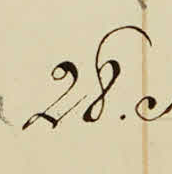28.
